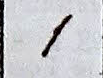1
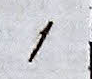1
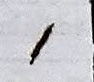1
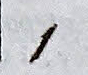1
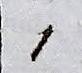1
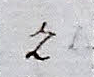2
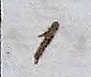1
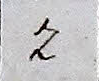2
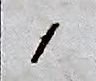1
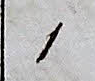1
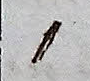1
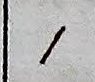1
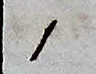1
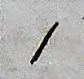1
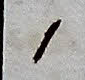1
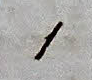1
